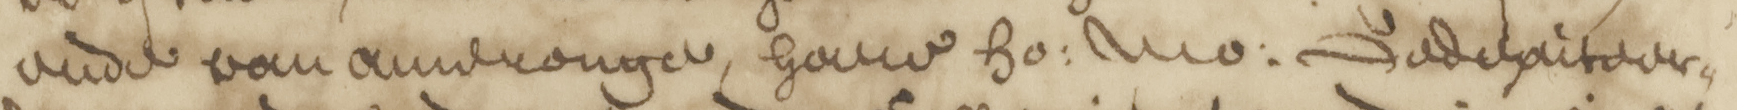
ende van ameronge, hare ho:Mo: Gedeputeer„
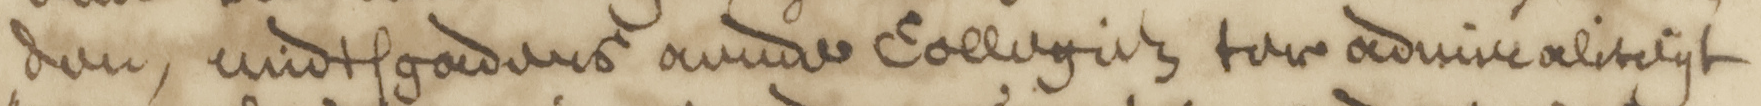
den, midtsgaders aende Collegien ter admiraliteijt
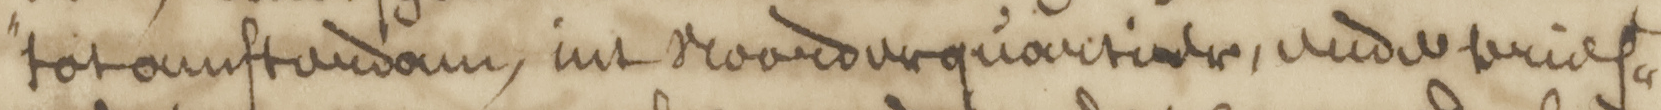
tot amsterdam, int Noorderquartier, ende vries„
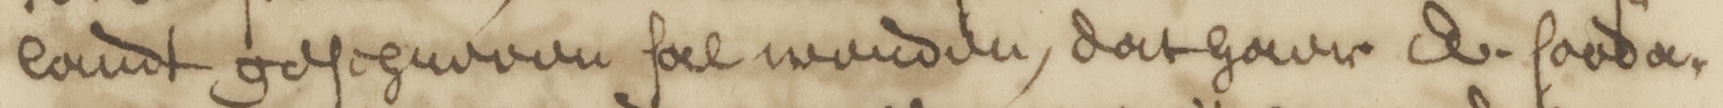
landt geschreven sal werden, dat haer E. sooda„
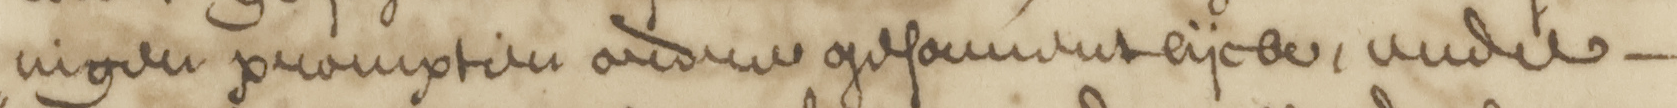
igen prompten ordre gesamentlijck, ende
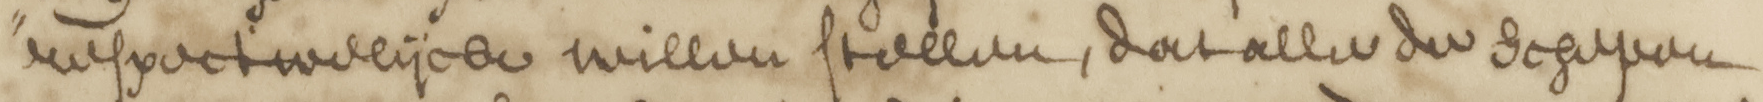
respectivelijck willen stellen, dat alle de schepen
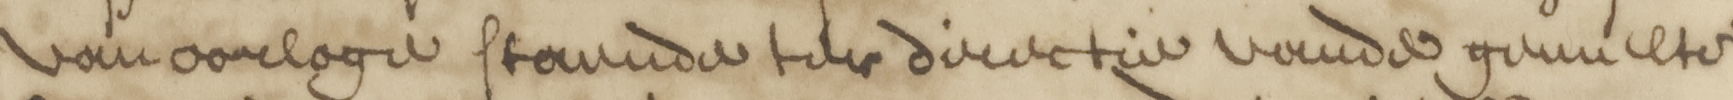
van oorloge staende ter directie vande gemelte
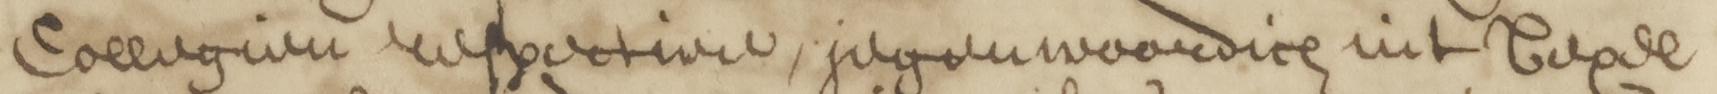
Collegien respective, jegenwoordich int Texel
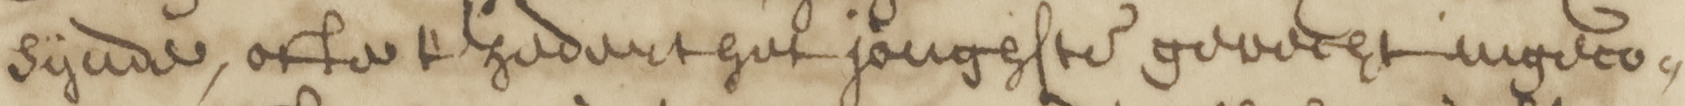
sijnde, ofte t' zedert het jonghste gevecht ingeco„
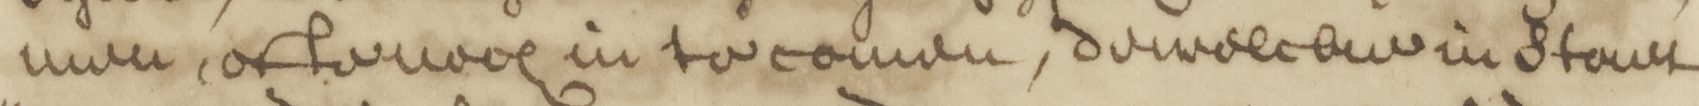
men, ofte noch in te comen, dewelcke in Staet
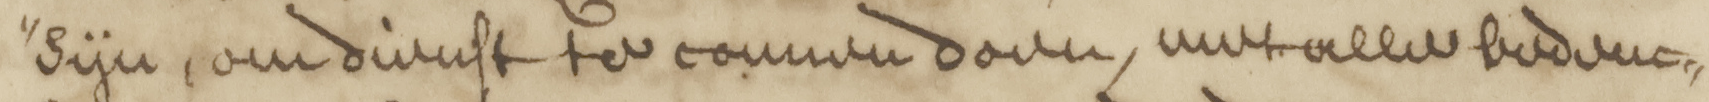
sijn, om dienst te connen doen, met alle bedenc,,
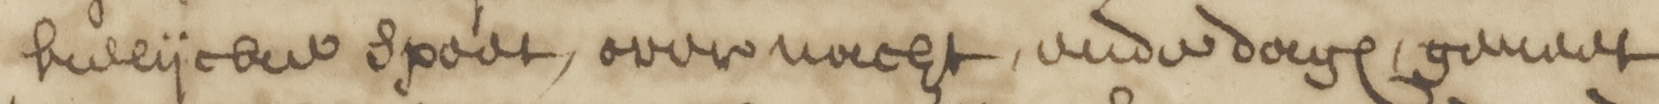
kelijcke spoet, over nacht, ende dagh, gereet
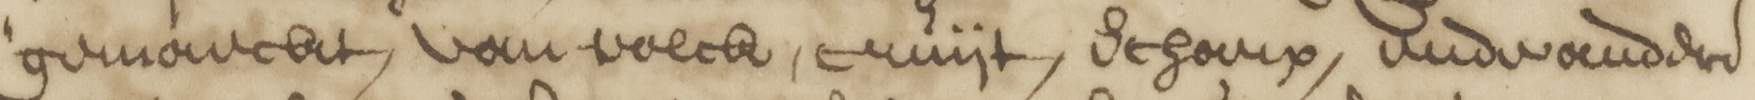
gemaeckt, van volck, cruijt, Scharp, ende andere
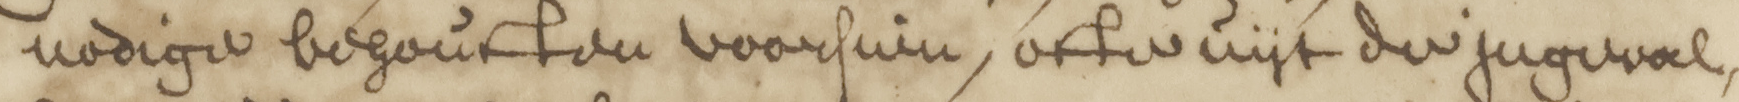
nodige behouften voorsien, ofte uijt de ingeval„
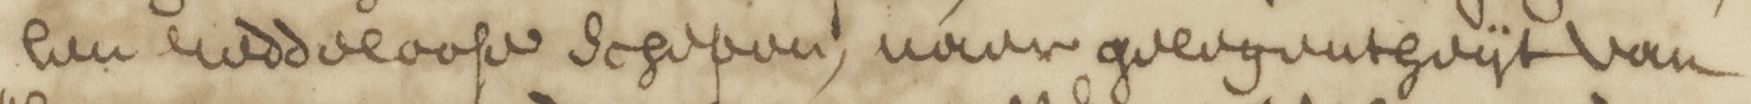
len reddeloose schepen, naer gelegentheijt van
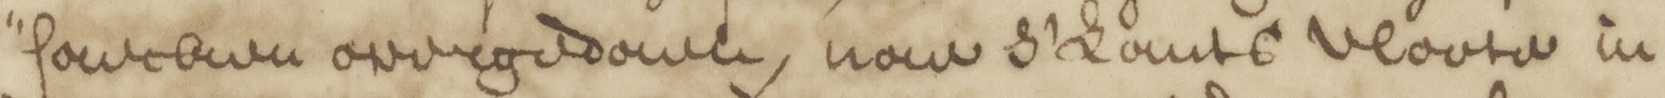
saecken overgedaen, nae s'Lants vloote in
